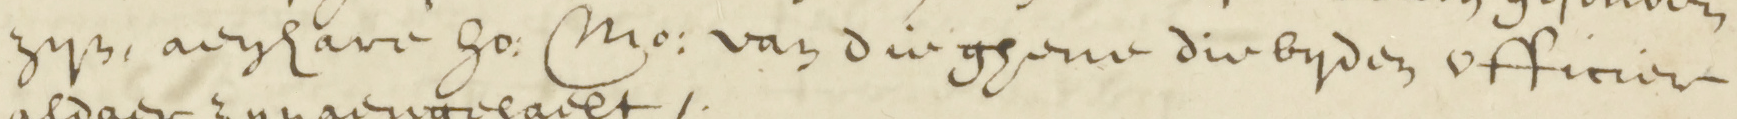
zyn, aen hare ho:Mo: van dieghene die byden officier
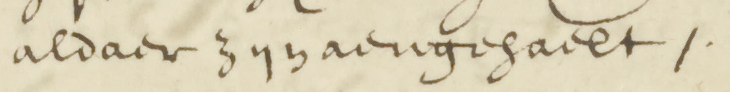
aldaer zyn aengehaelt.
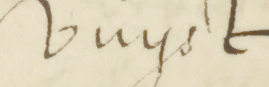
vuyst
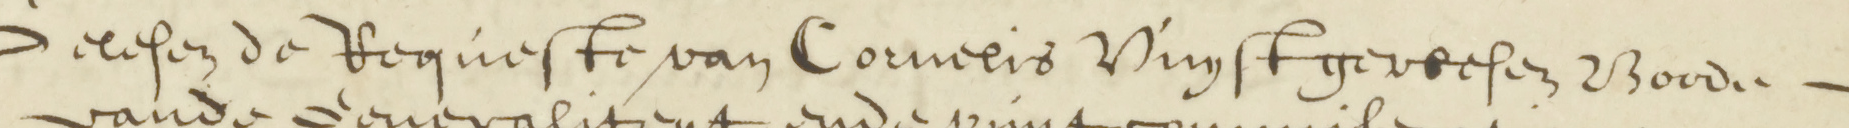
Gelesen de Requeste van Cornelis Vuyst gewesen Boode -
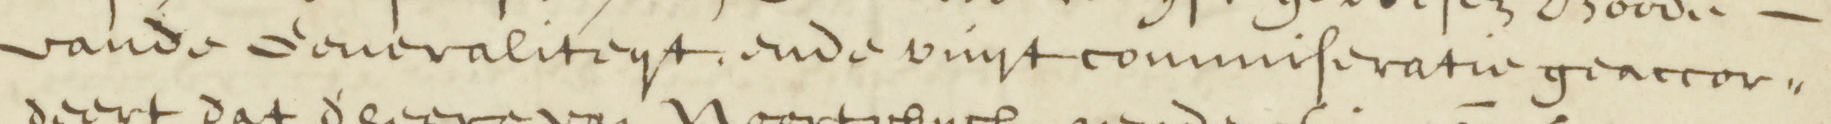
vande Generaliteyt, ende vuyt commiseratie geaccor„
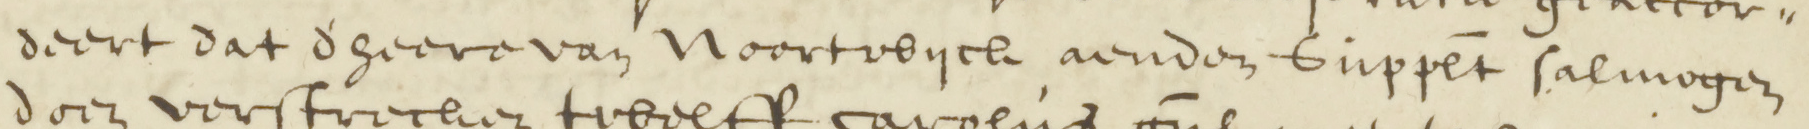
„deert dat d'heere van Noortwyck aenden Supplt sal mogen
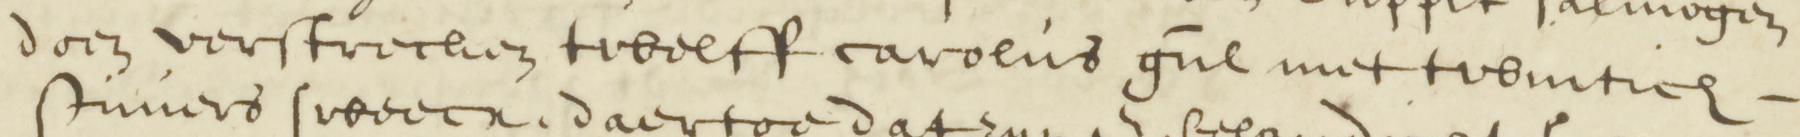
doen verstrecken twelff carolus gul met twintich —
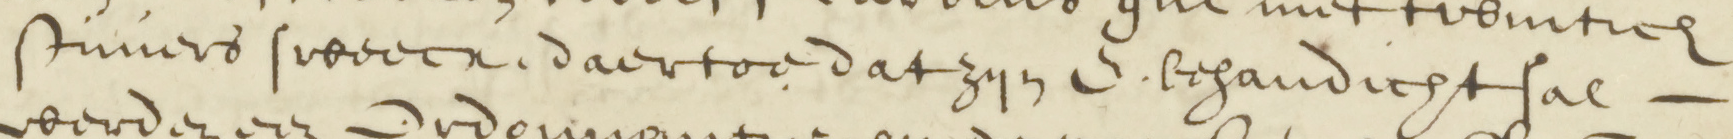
stuuers sweecx, daertoe dat zyn E. behandicht sal —
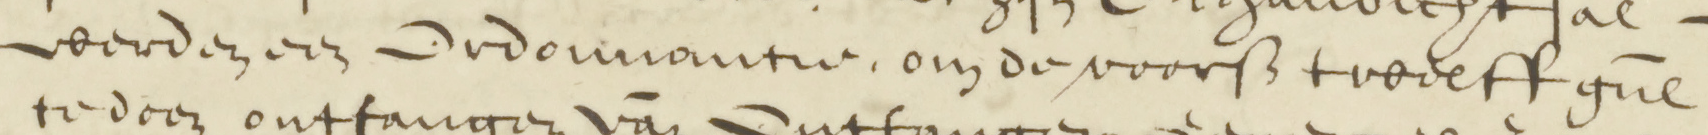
werden een Ordonnantie, om de voors twelff gul
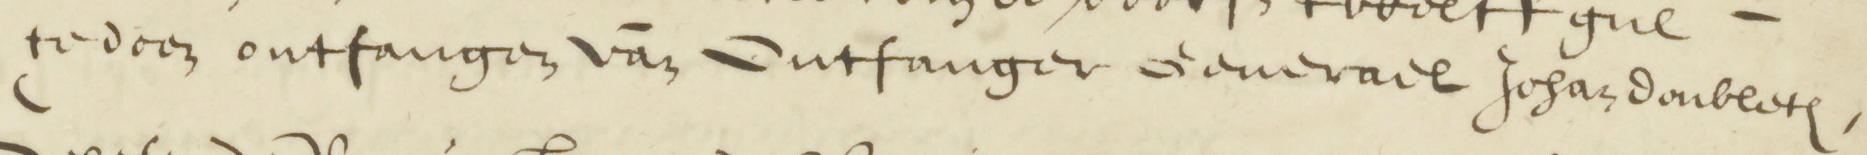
te doen ontfangen van Ontfanger Generael Johan doubleth,
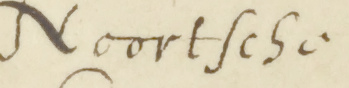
Noortsche
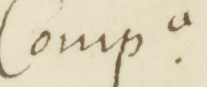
Compe.
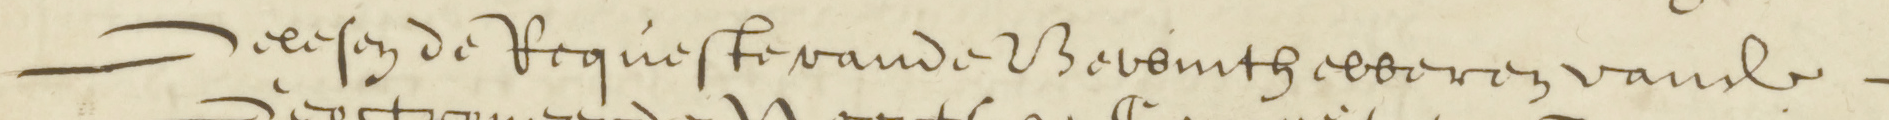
Gelesen de Requeste vande Bewinthebberen vande
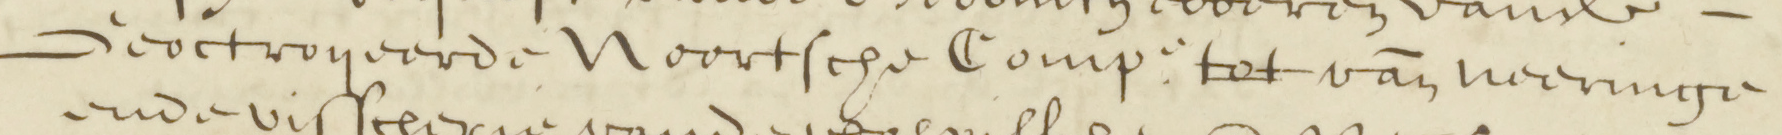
Geoctroyeerde Noortsche Compe tot van neeringe
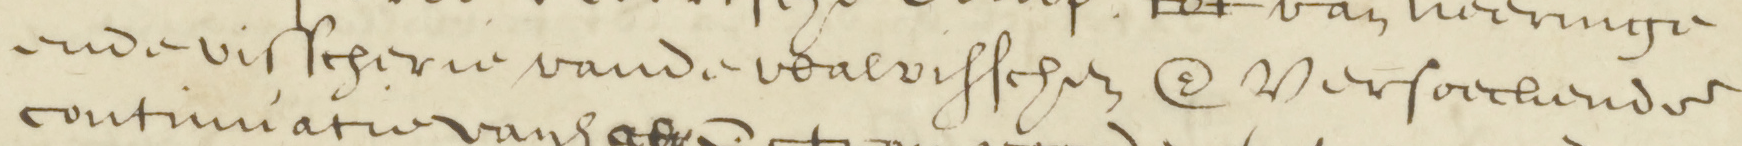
ende visscherie vande walvisschen @ Versoeckende
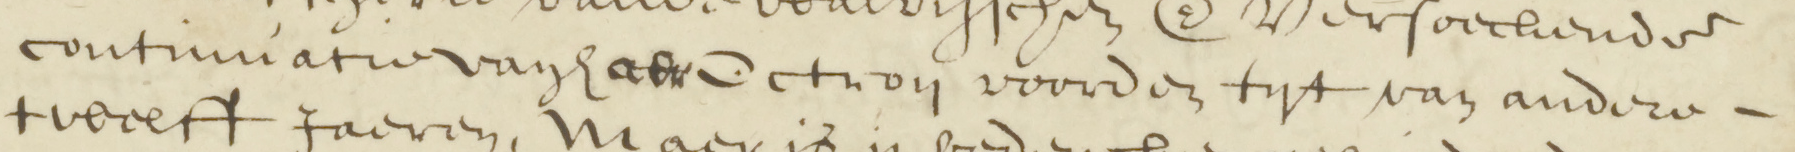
continuatie van haer Octroy voorden tyt van andere -
